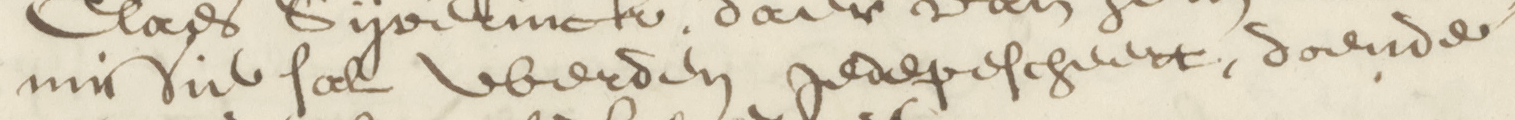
missie sal werden gedepescheert, doende
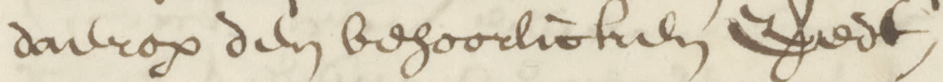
daerop den behoorlicken Eedt.
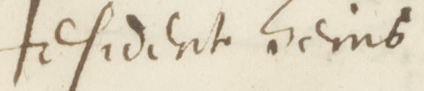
Resident heins
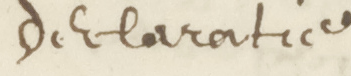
declaratie
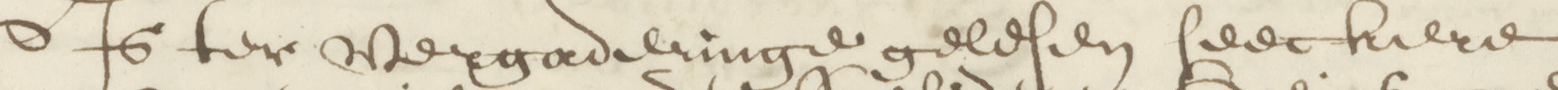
Is ter Vergaderinge gelesen seeckere
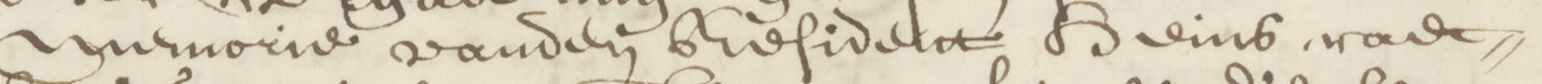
Memorie van den Resident Heins raec„
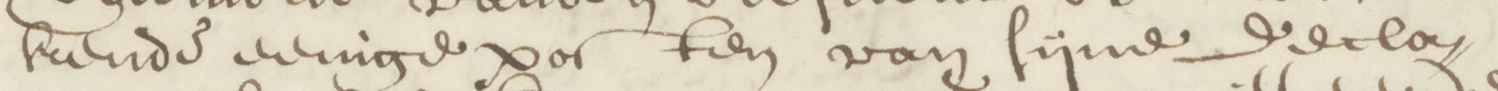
kende eenige posten van sijne Decla„
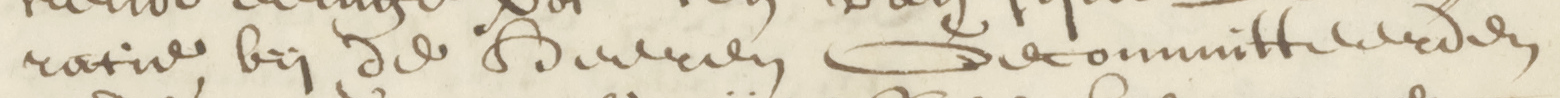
ratie bij de Heeren Gecommitteerden
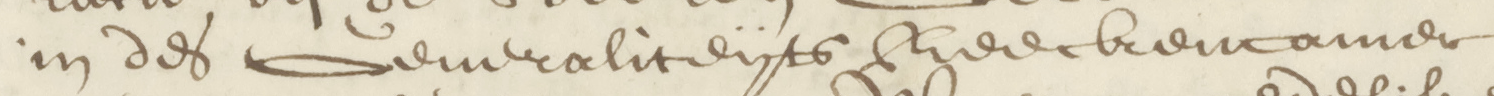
in des Generaliteijts Reeckencamer
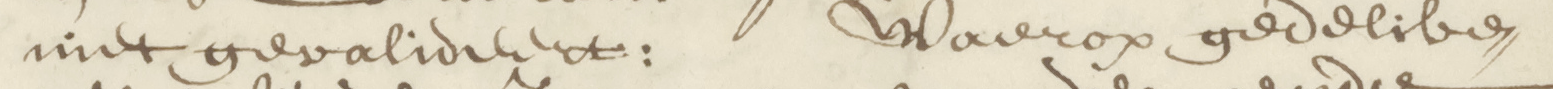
niet gevalideert: Waerop gedelibe„
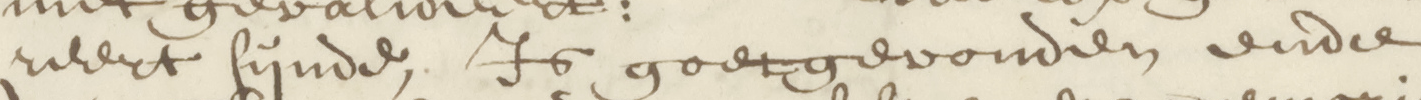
reert sijnde, Is goetgevonden ende
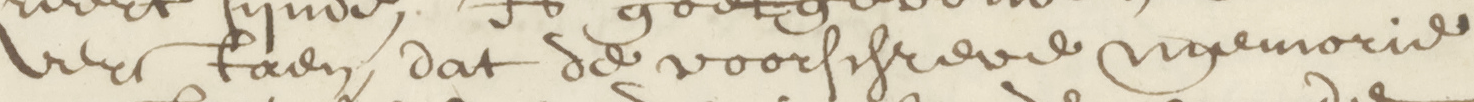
verstaen, dat de voorschreve memorie
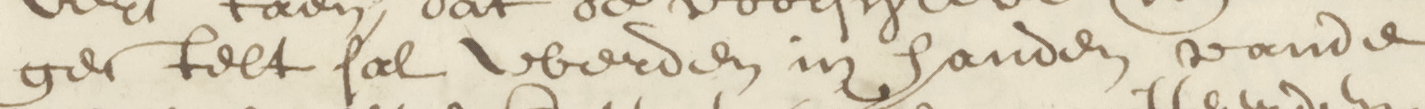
gestelt sal werden in handen vande
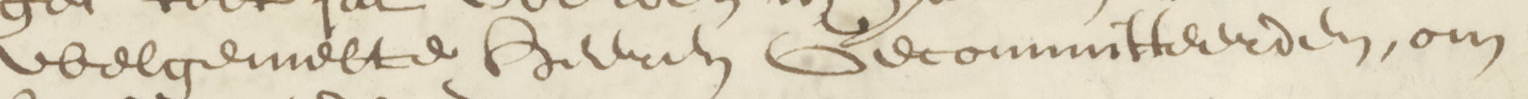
welgemelte Heeren Gecommitteerden, om
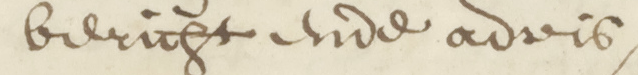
bericht ende advis.
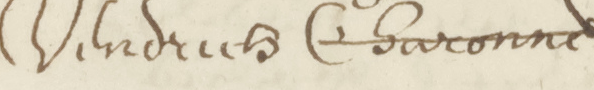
Vendrich Charonne
